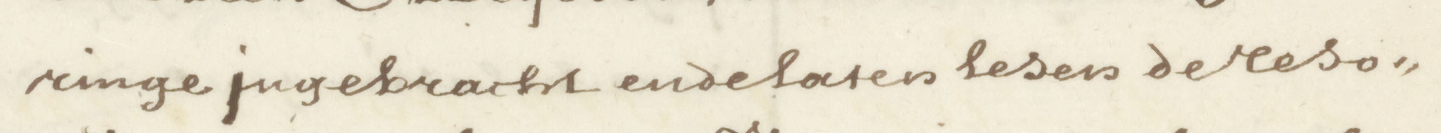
ringe ingebracht ende laten lesen de reso„
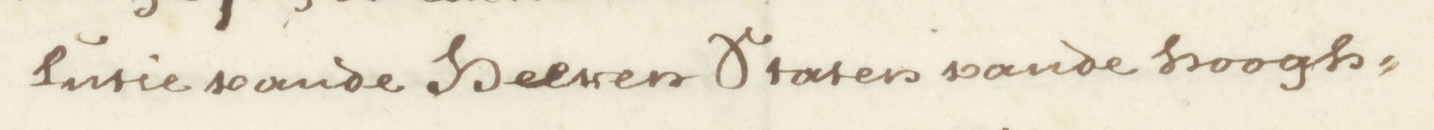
lutie vande Heeren Staten vande Hoogh„,
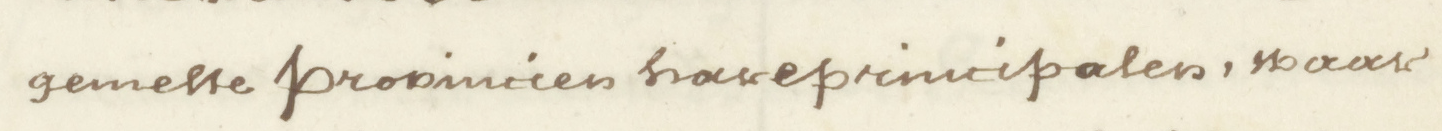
gemelte provincien hare principalen, waar
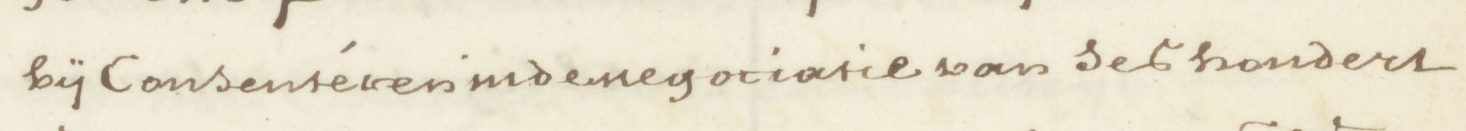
bij consenteren inde negociatie van ses hondert
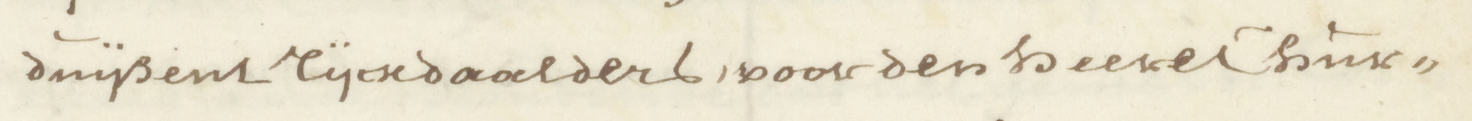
duijsent rijcxdaalders, voor den Heere Chur„
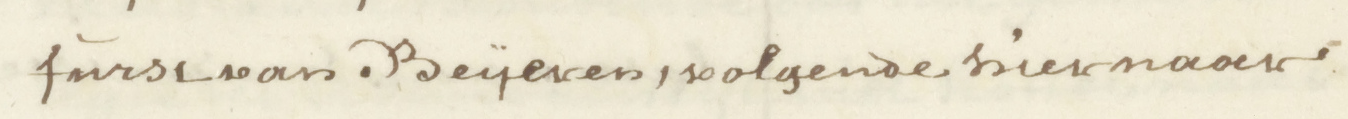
furst van Beijeren, volgende hier naar
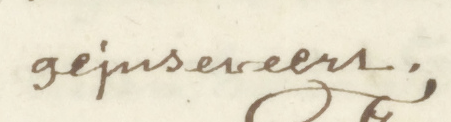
geinsereert.
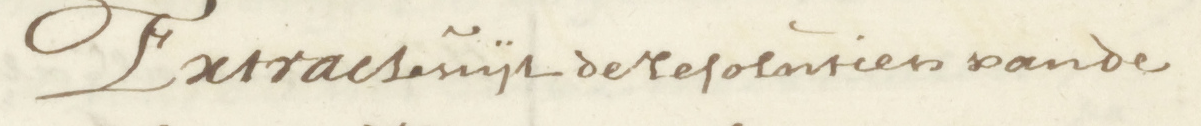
Extract uijt de resolutien vande
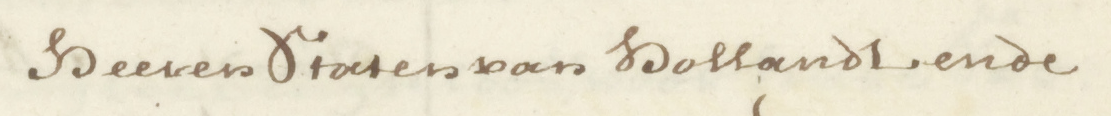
Heeren Staten van Hollandt ende
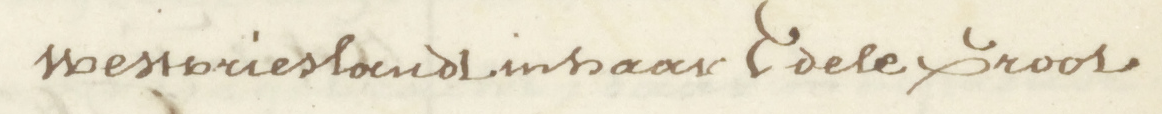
westvrieslandt in haar Edele Groot
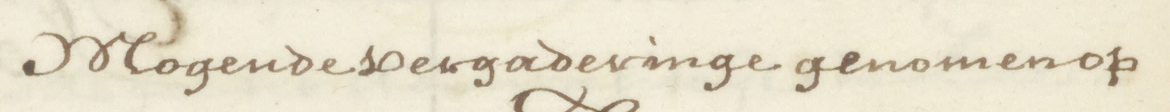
Mogende vergaderinge genomen op
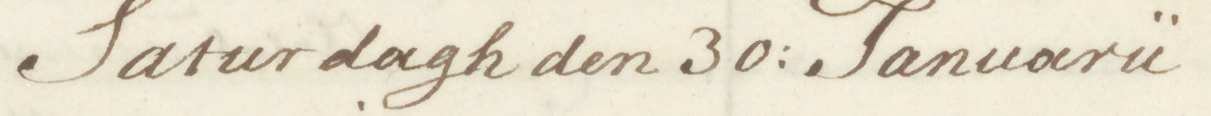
Saturdagh den 30: Januarii
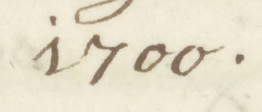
1700.
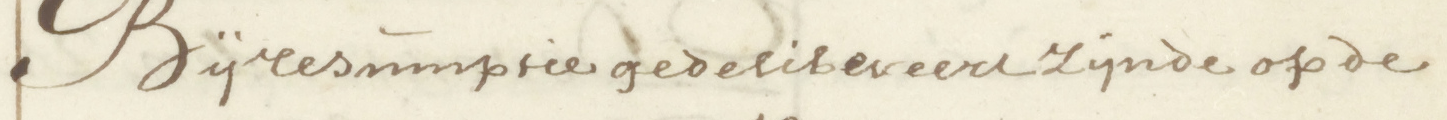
Bij resumptie gedelibereert zijnde op de
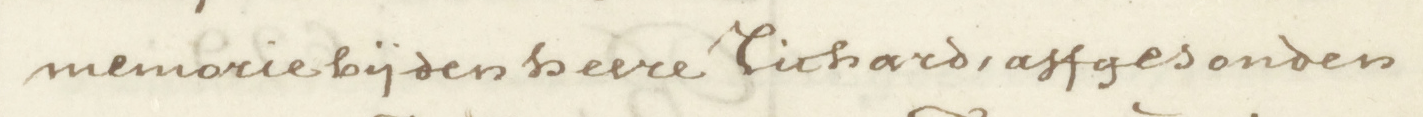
memorie bij den heere Richard, affgesonden
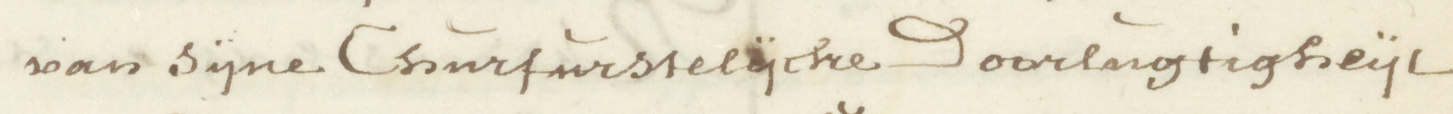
van Sijne Churfurstellijcke Doorligtigheijt
